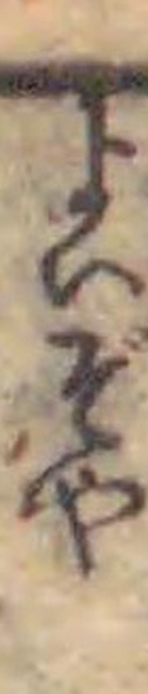よいぞや

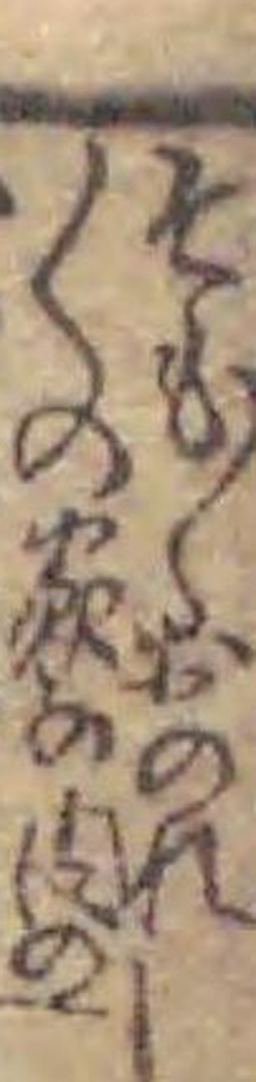〳〵の家の内の
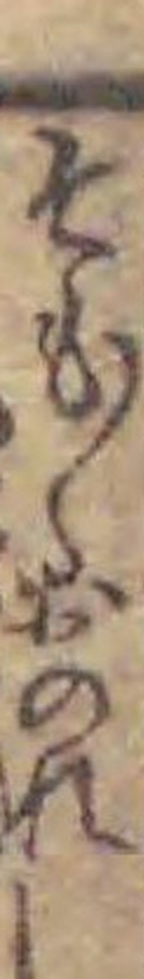そも〳〵おのれ
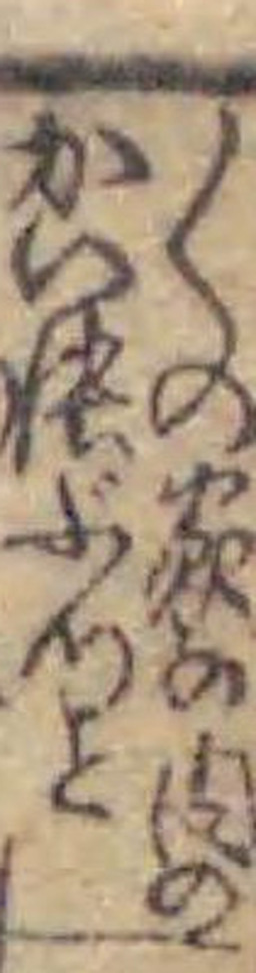かい帳ぶつを
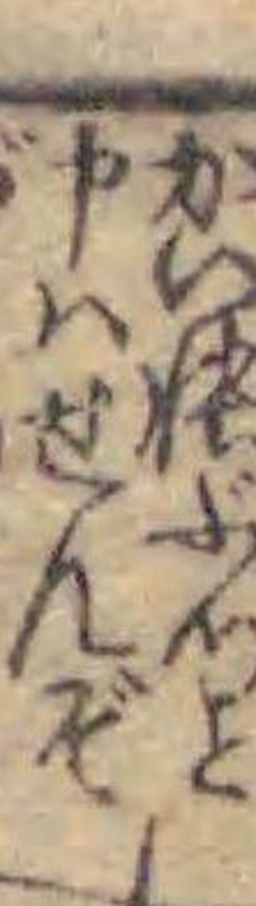申はせんぞ
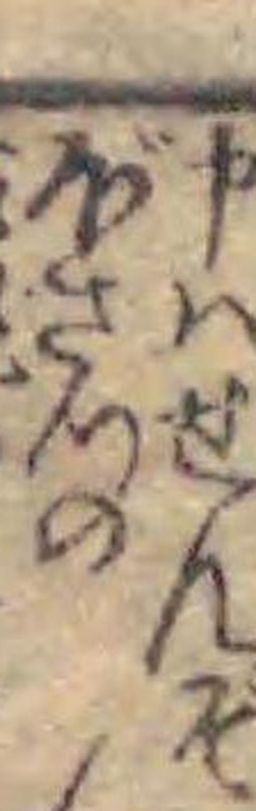ぼさつの
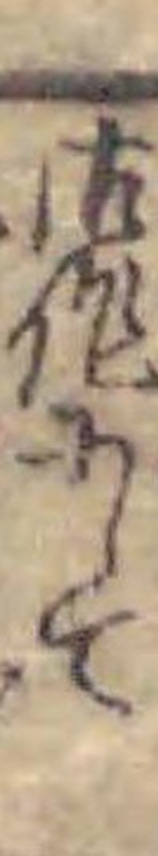御作にして
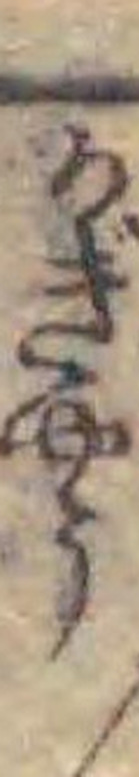かぎやう
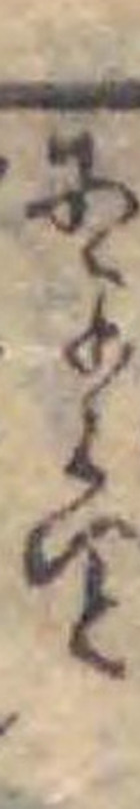によらいと
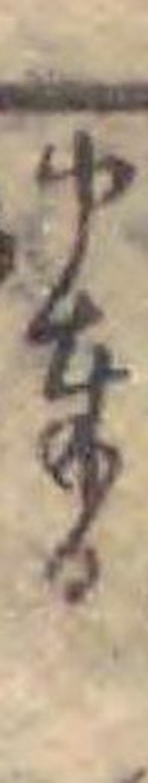申奉る
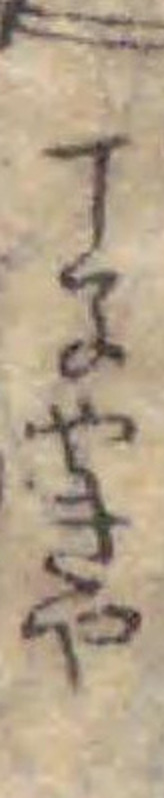丁子やきや
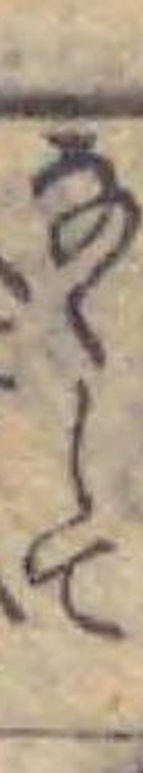なくして
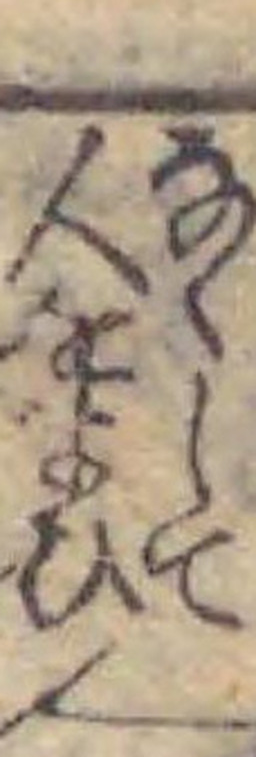人をよひ
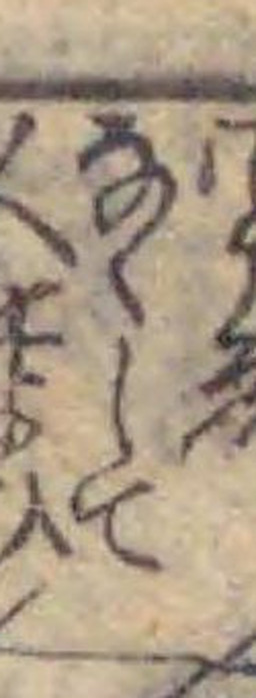なくして
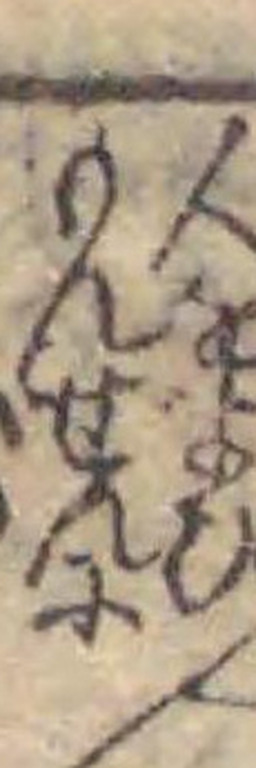もんぜんに
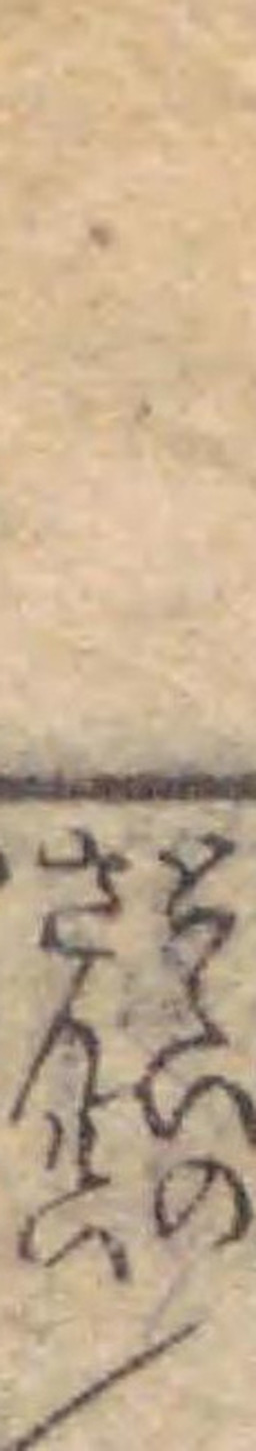さんけい
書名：身体開帳略縁起 : 3巻
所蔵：国立国会図書館 National Diet Library, JAPAN
